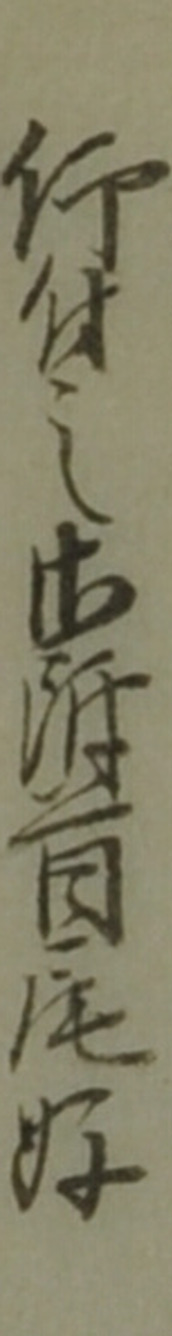仰付之御附首尾好
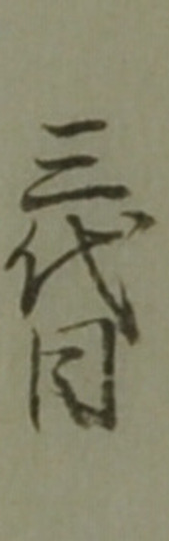三代目
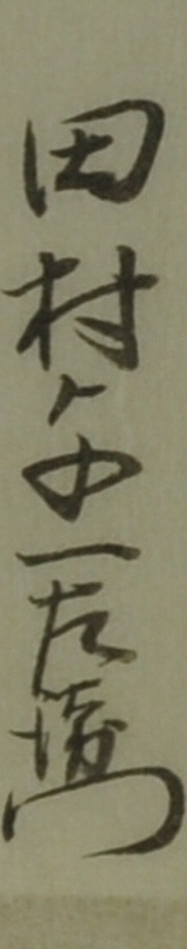田村与一左衛門
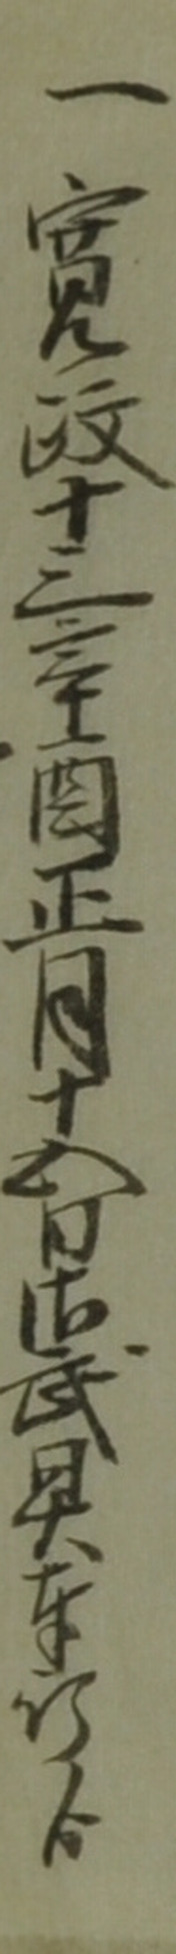一寛政十三辛酉正月十五日御武具奉行ゟ
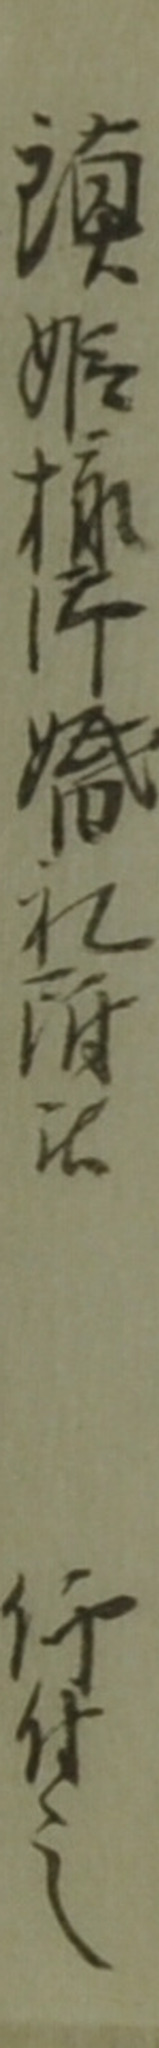鎮姫様御婚礼附被仰付之
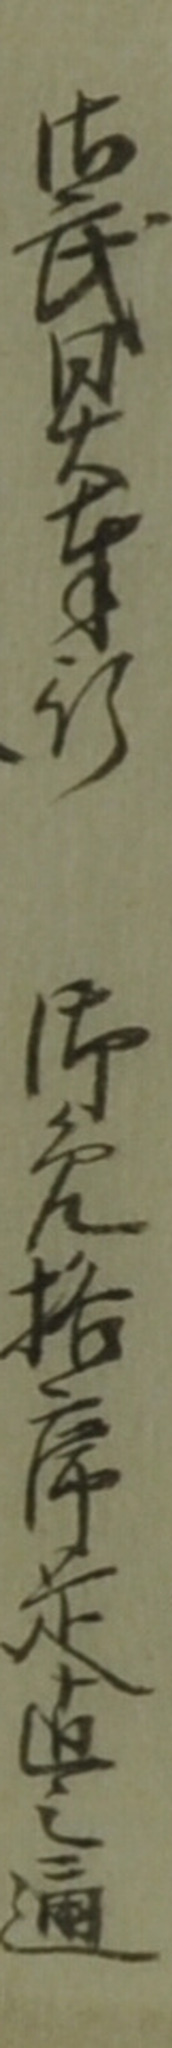御武具奉行御免格席是迄之通
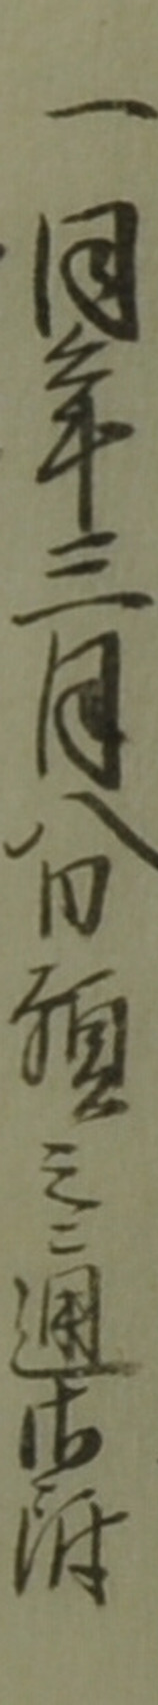一同年三月八日願之通御附
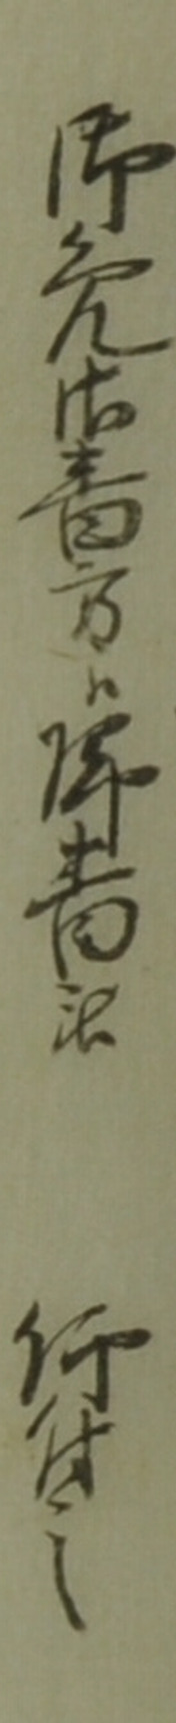御免御番方江帰番被仰付之

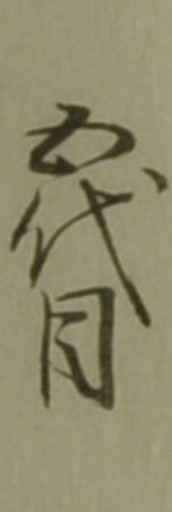五代目
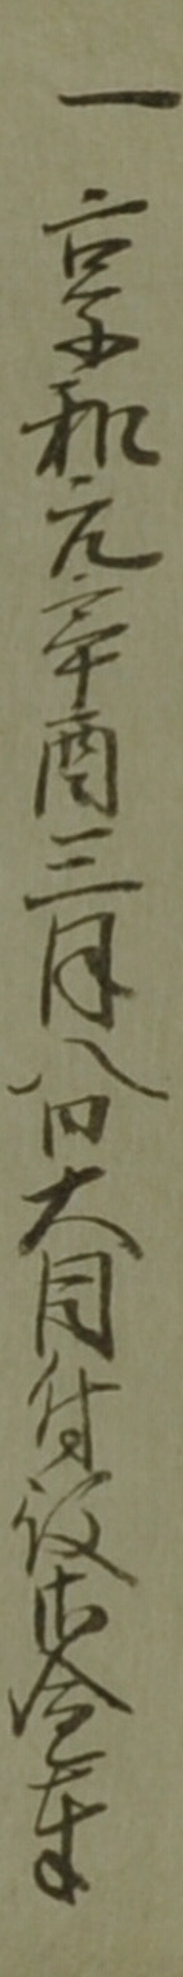一享和元辛酉三月八日大目付役御金奉
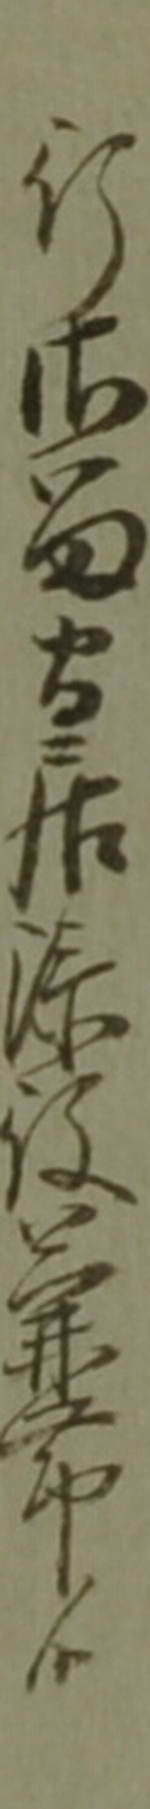行御留守居添役兼帯ゟ
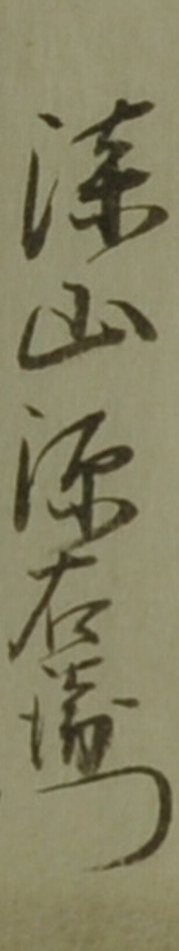◻︎山源右衛門
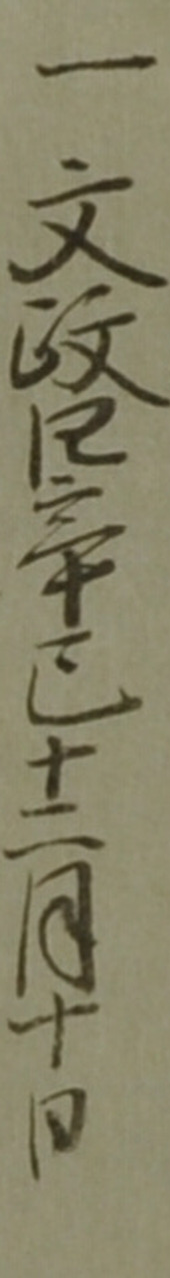一文政四辛巳十二月十日
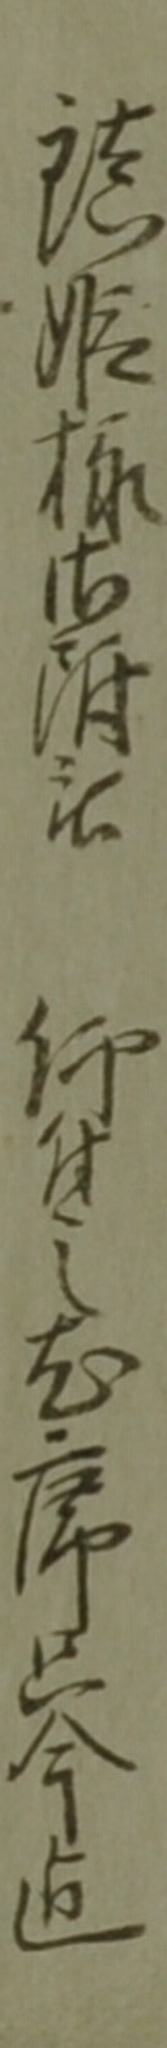鎮姫様御附被仰付之尤席只今迄
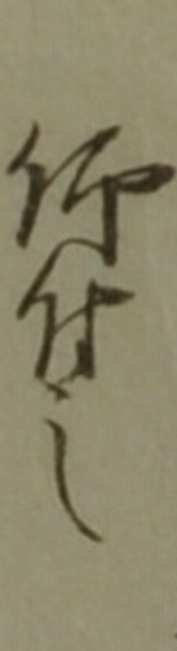仰付之
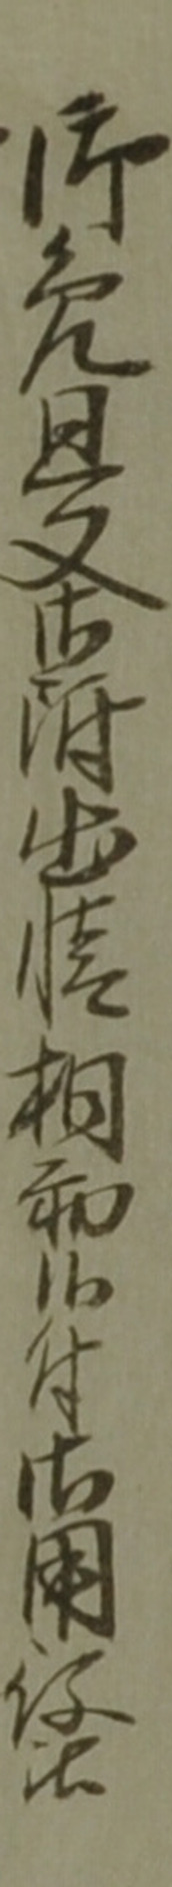御免且又御附出精相勤候付御用役被
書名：諸御役代々録（六）
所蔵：伊那市立高遠町図書館・合同会社AMANE
